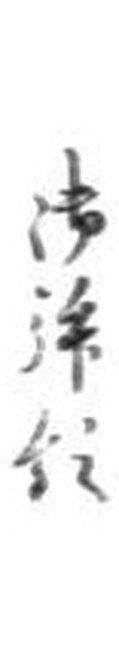御拝領
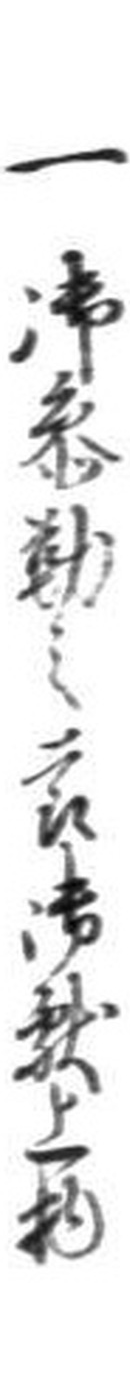一御参勤之節御献上物
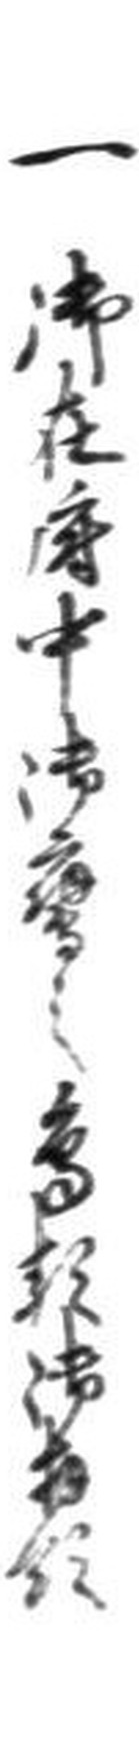一御在府中御鷹之鳥類御拝領

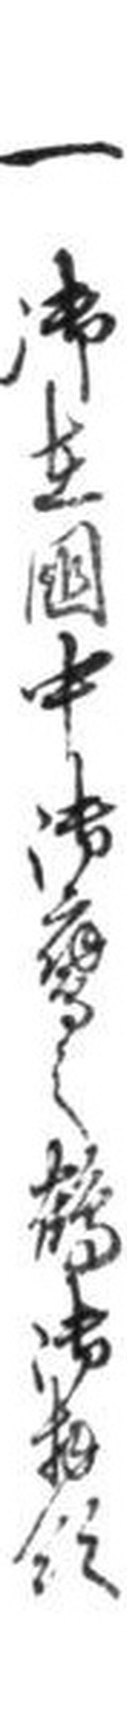一御在国中御鷹之鶴御拝領
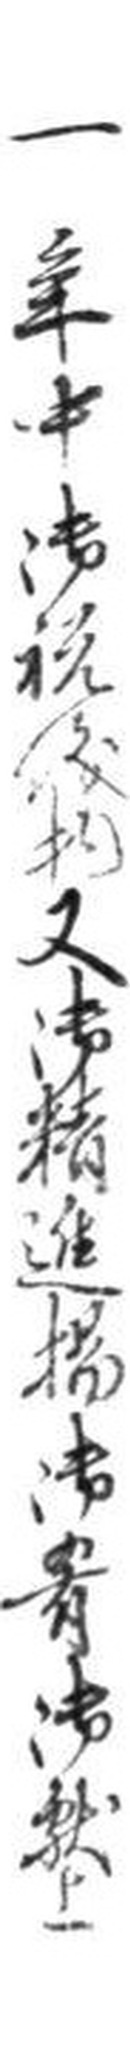一年中御祝儀物又御精進揚御肴御献上
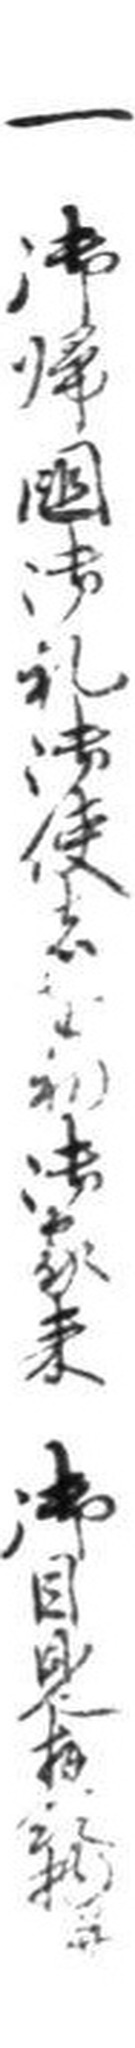一御帰国御礼御使者を初御家来御目見拝領物并
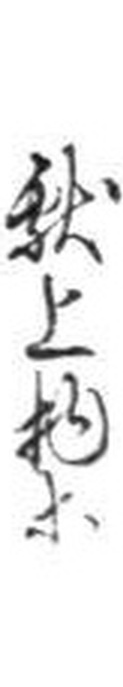献上物等
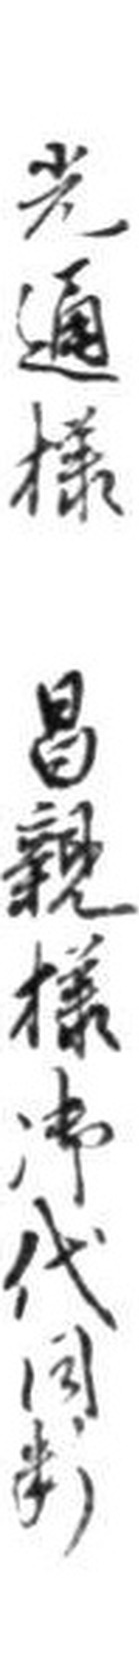光通様昌親様御代同断
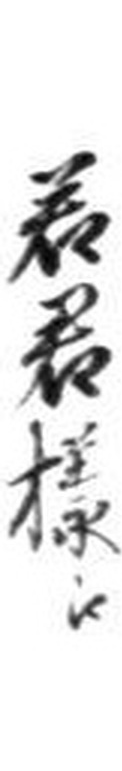若君様江
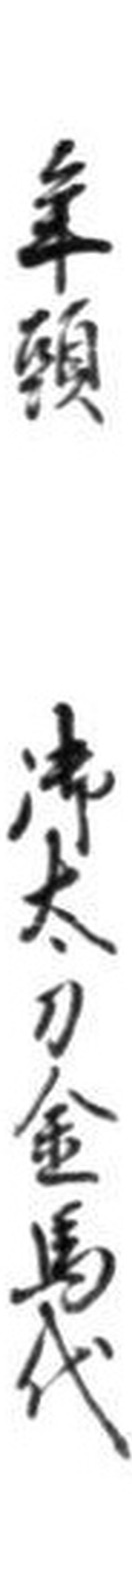年頭御太刀金馬代
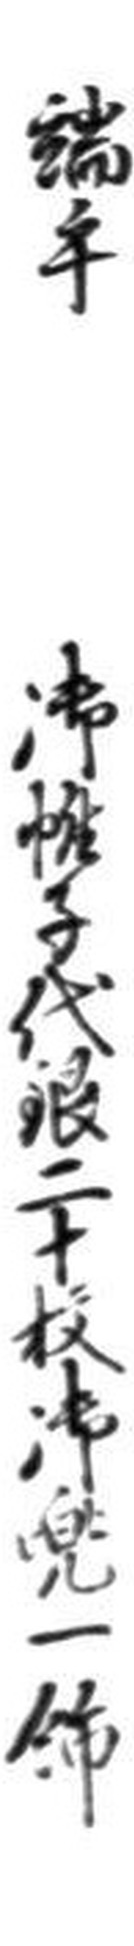端午御帷子代銀二十枚御兜一飾
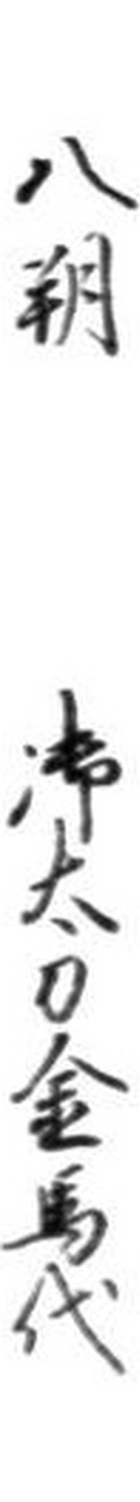八朔御太刀金馬代
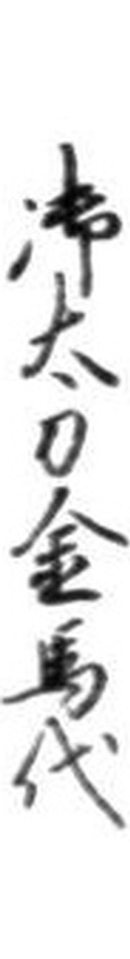年頭御太刀金馬代
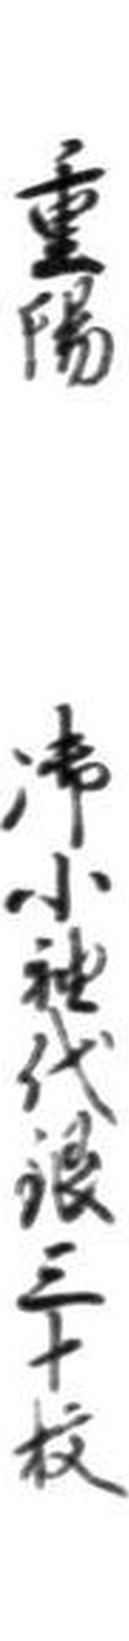重陽御小袖代銀三十枚
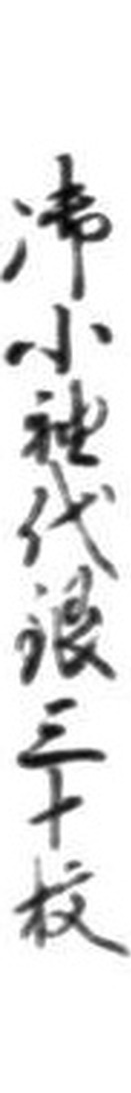重陽御小袖代銀三十枚
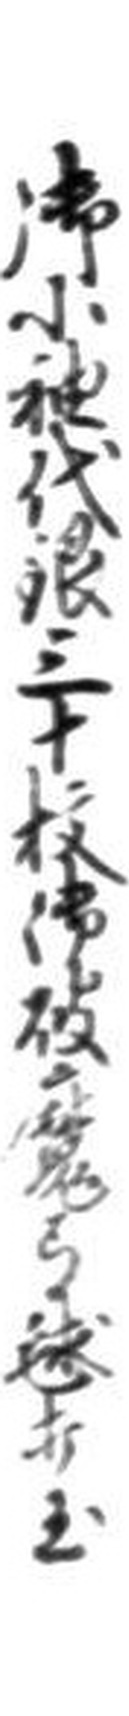歳暮御小袖代銀三十枚御破魔弓毬打玉
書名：家譜 十五 綱昌公 従天和元年到元禄十二年
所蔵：福井県文書館 Fukui Prefectural Archives
